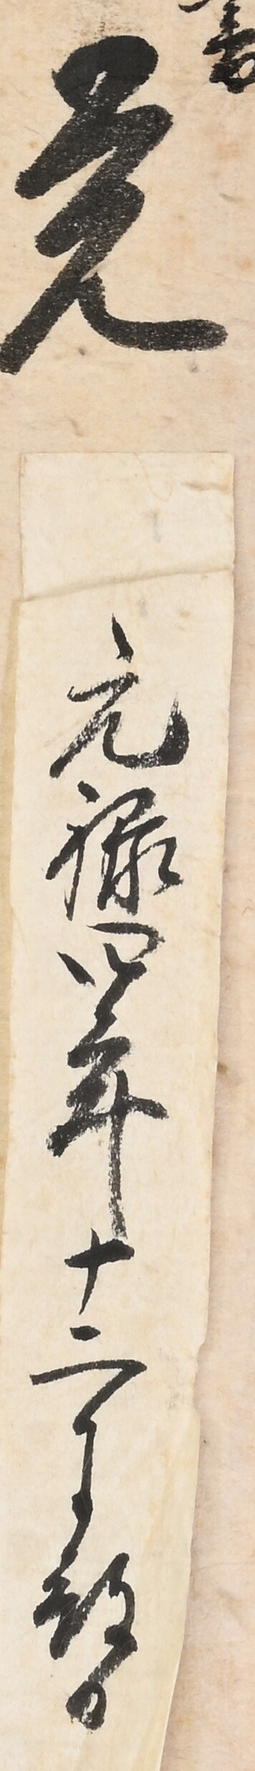元禄四年十二月朔日
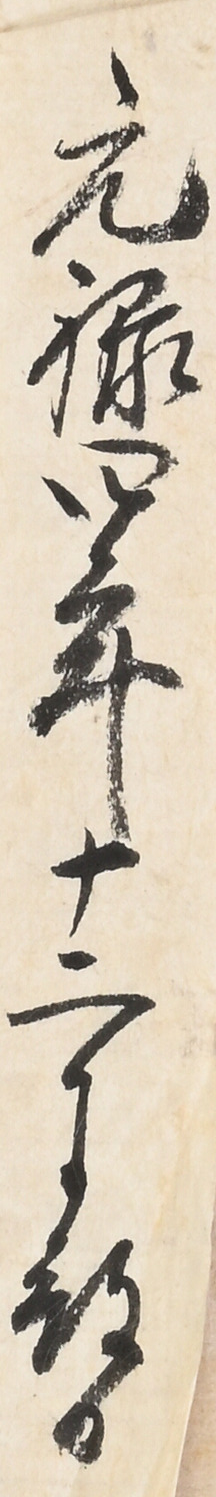元禄四年十二月朔日

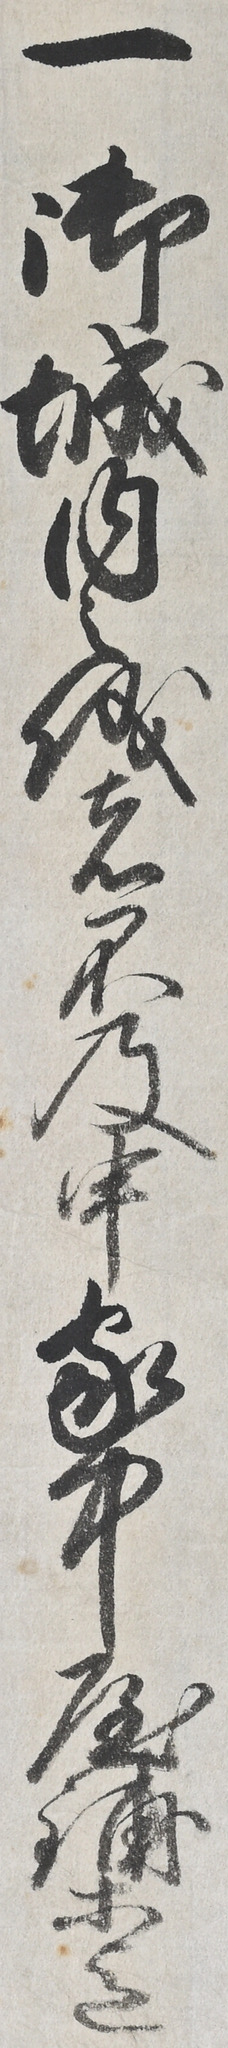一御城内之儀者不及申家中屋鋪等迄
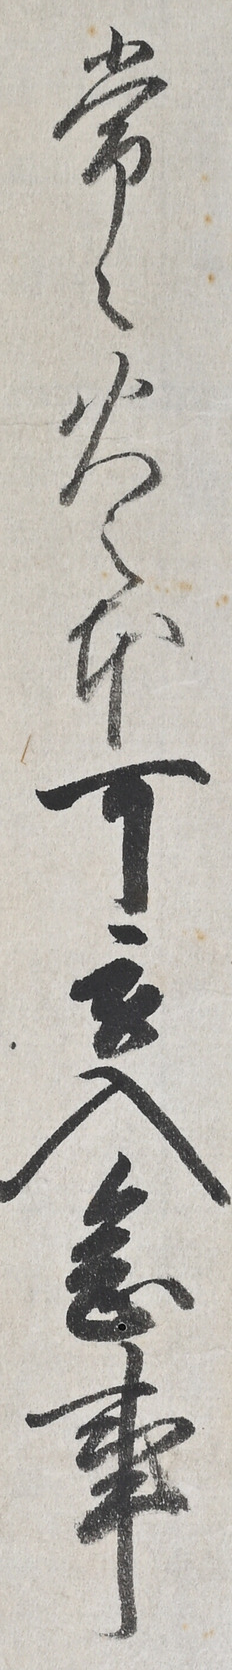常々火之本可被入念事
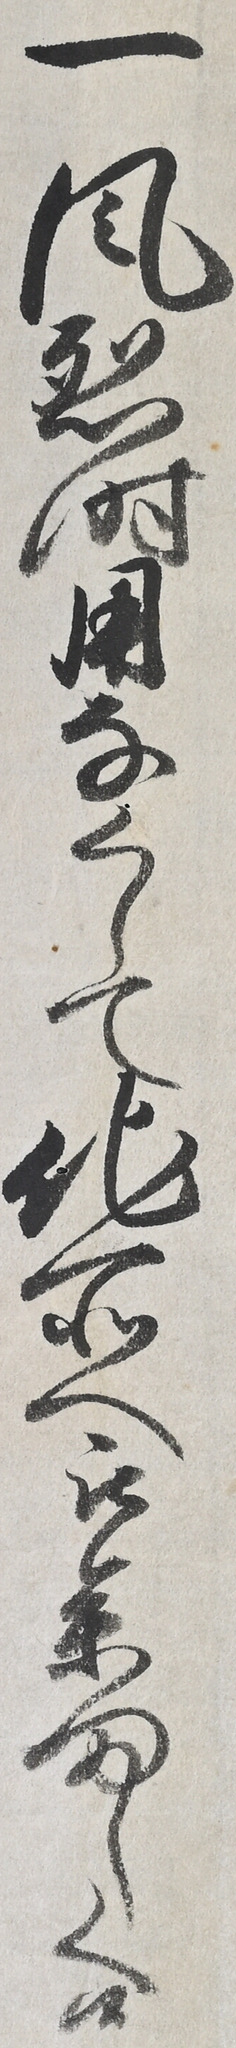一風烈時用なくして他所へ被参ましく候
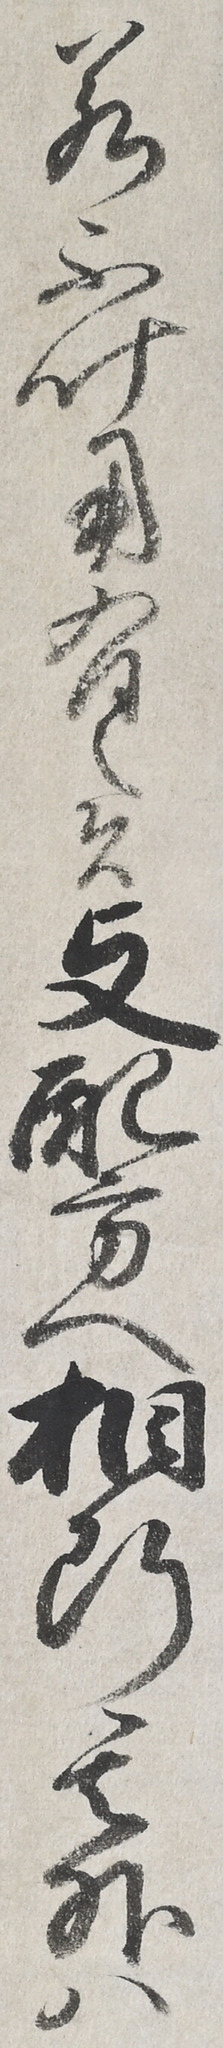若不叶用有之者支配方へ相断其外ハ
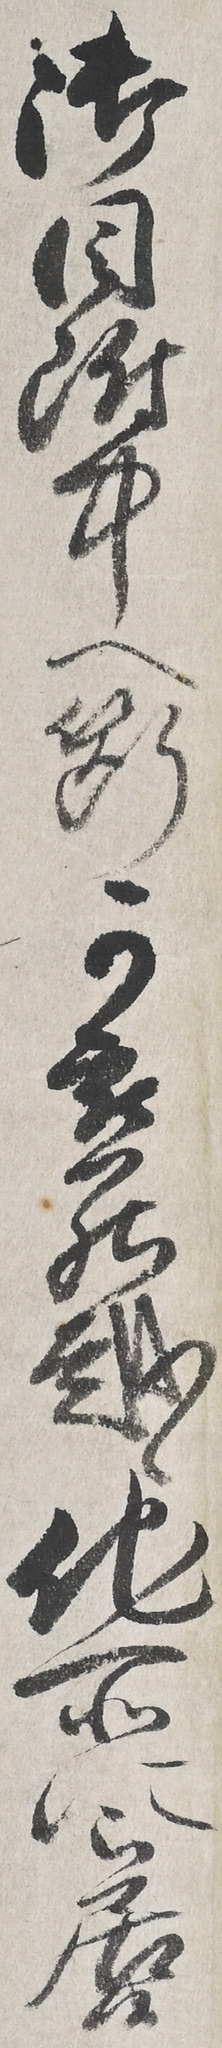御目附中へ断可被罷越候他所に被居候
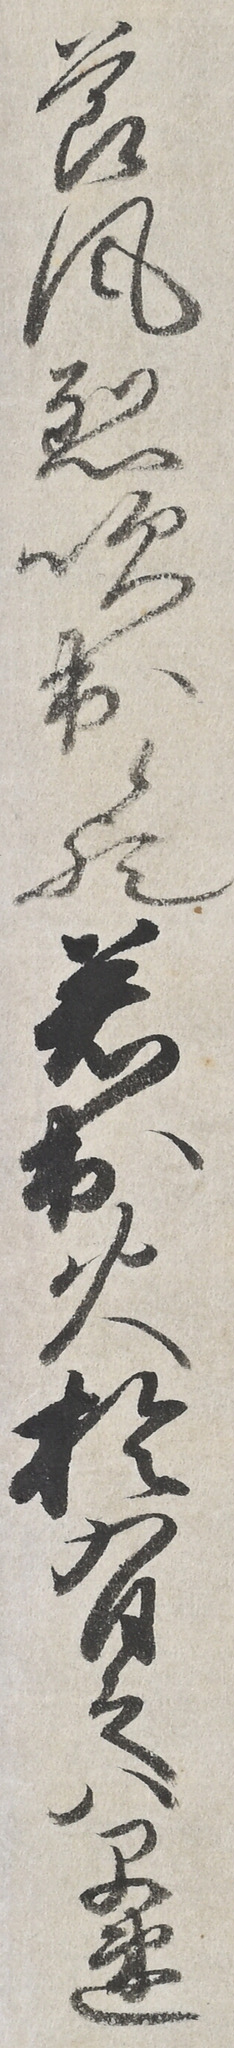節風烈吹出候歟若出火於有之ハ早速
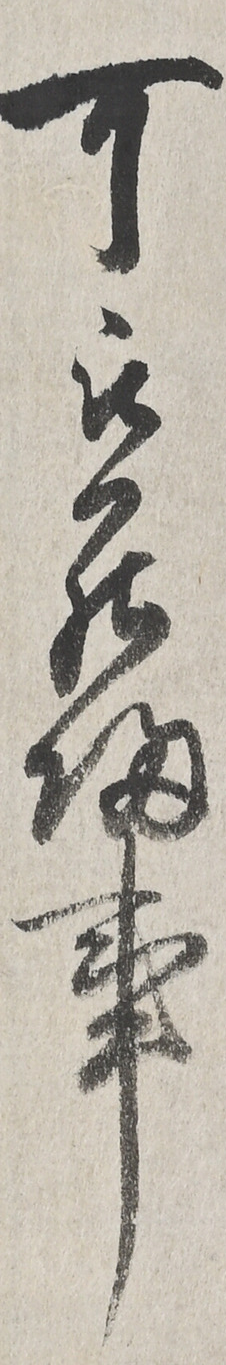可被罷帰事
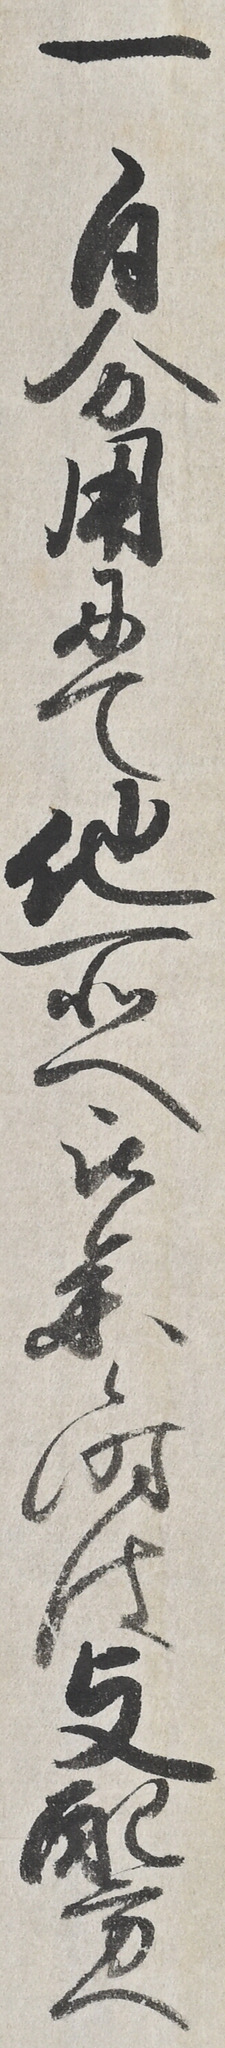一自分用にて他所へ被参候時は支配方へ
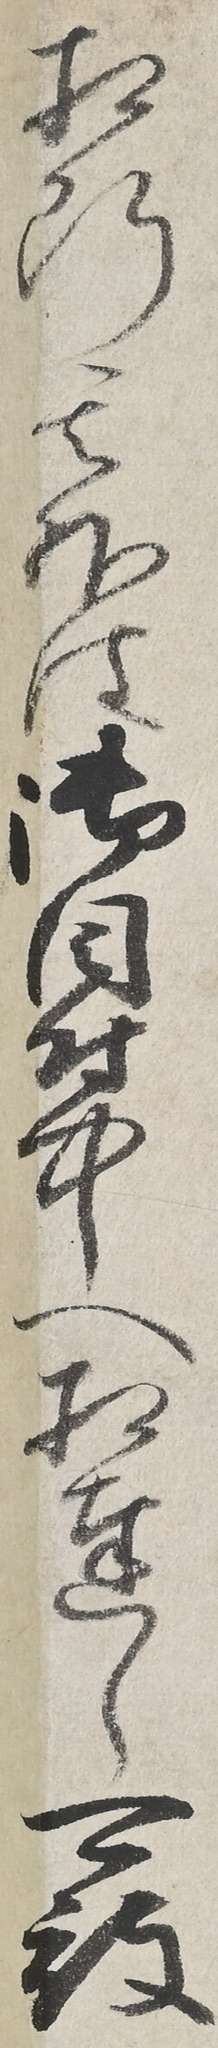相断其外は御目付中へ相達し可致

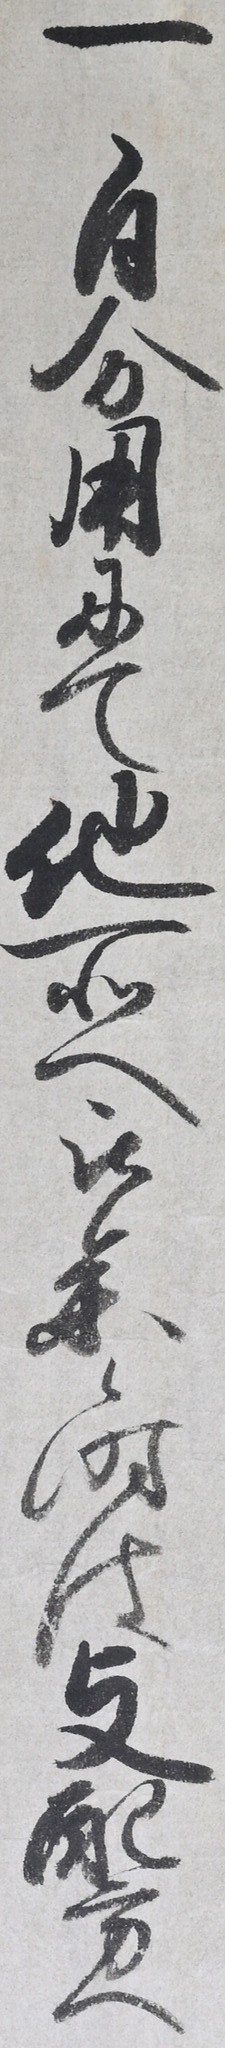一自分用にて他所へ被参候時は支配方へ
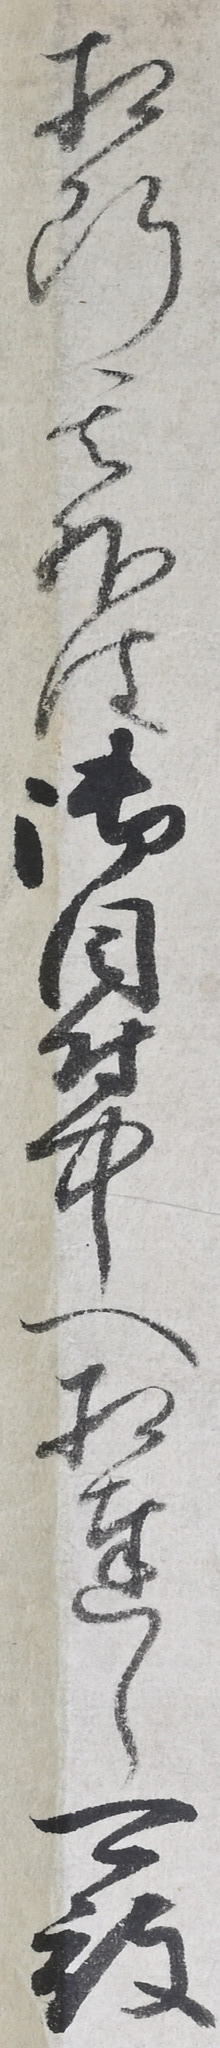相断其外は御目付中へ相達し可致
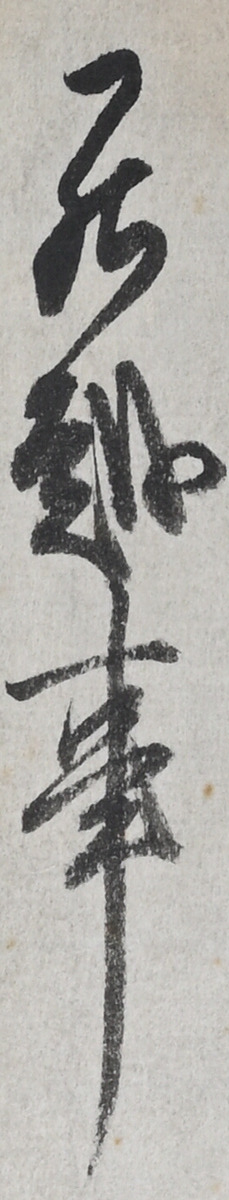罷越事
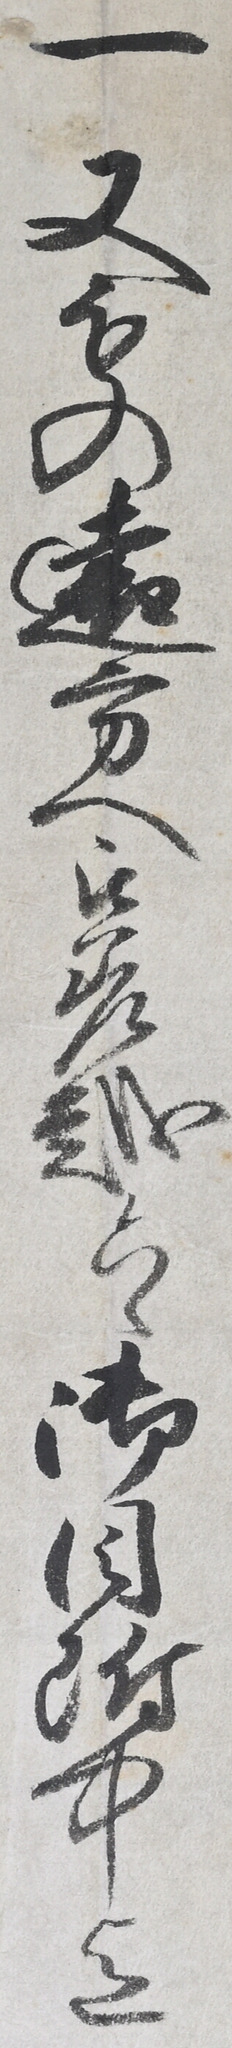一又もの遠方へ被差越候ハヽ御目附中迄
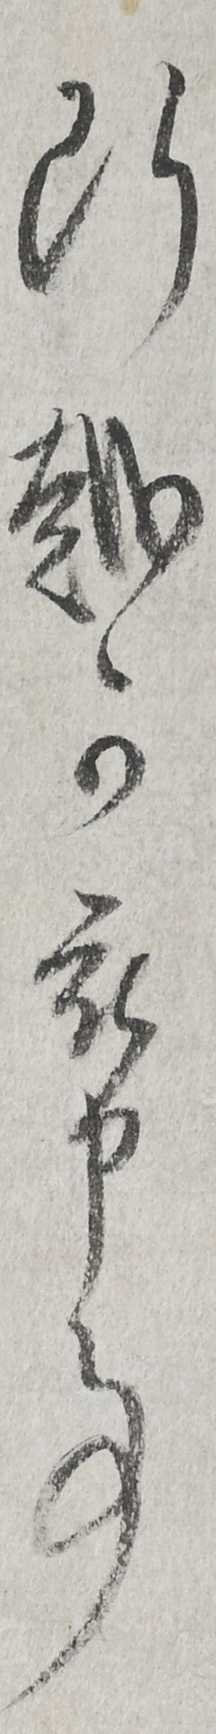断越可被申事
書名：覚
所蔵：伊那市立高遠町図書館・合同会社AMANE
